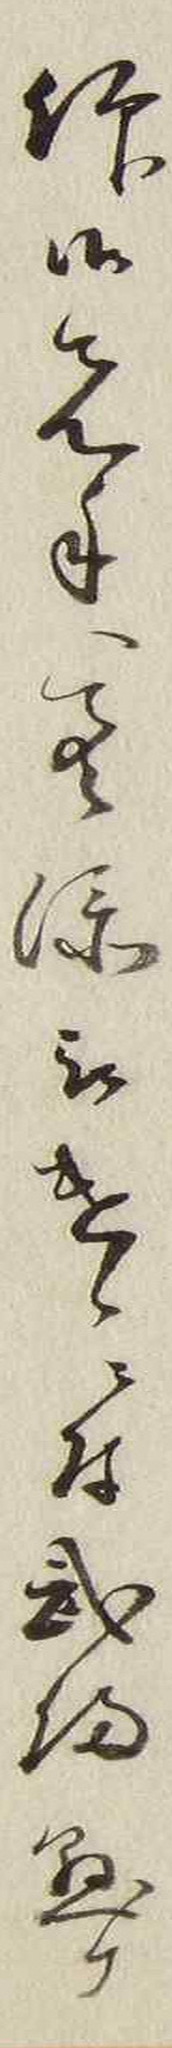仰候先手へ有添被遣候に付武備懸り

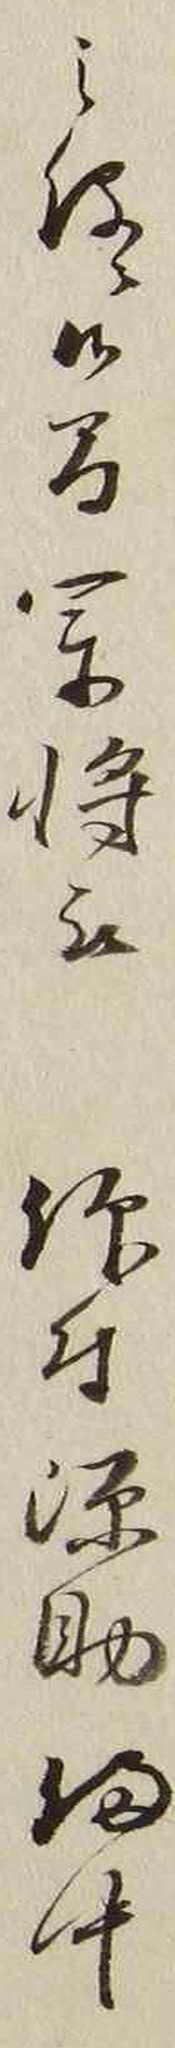之儀に候間軍将被仰付源助備中
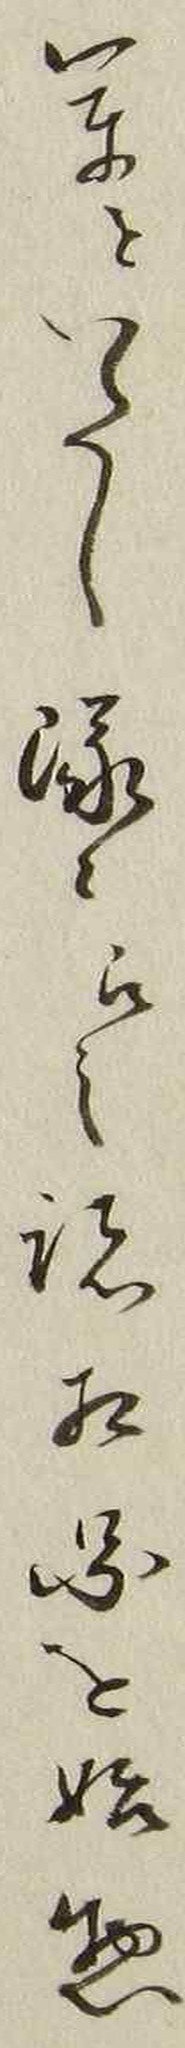軍といたし隊々江之諸相図を始惣
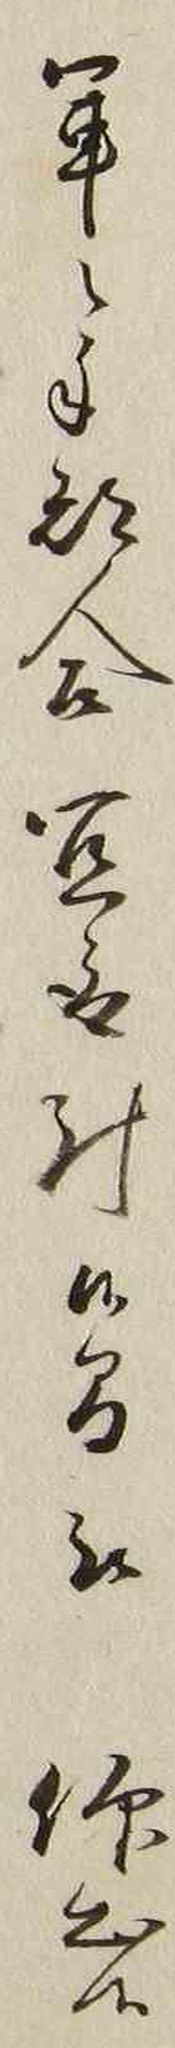軍之手都合宜取計候間被仰出候
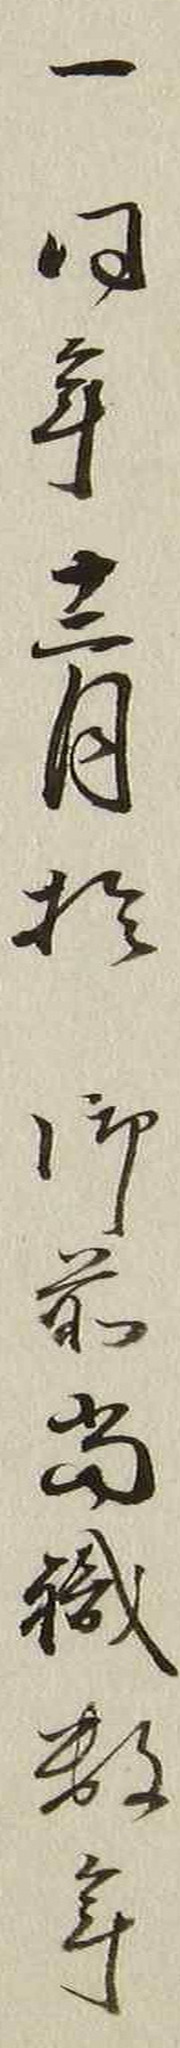一同年三月於御前当職数年
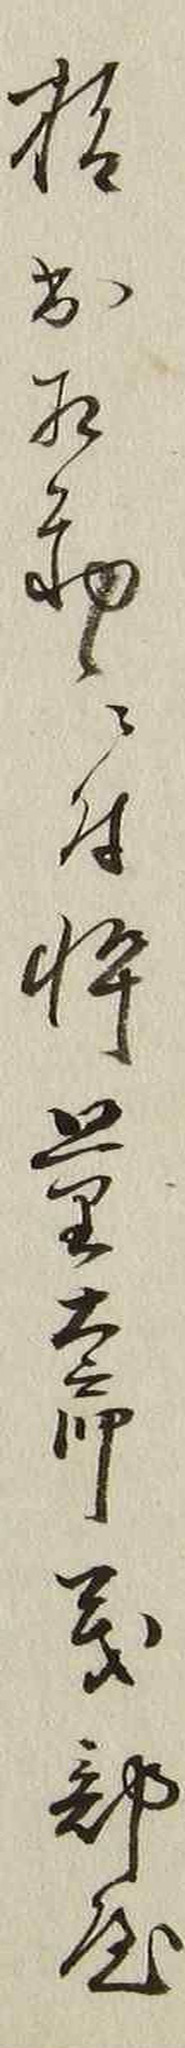精出相勤候に付忰量太郎義部屋
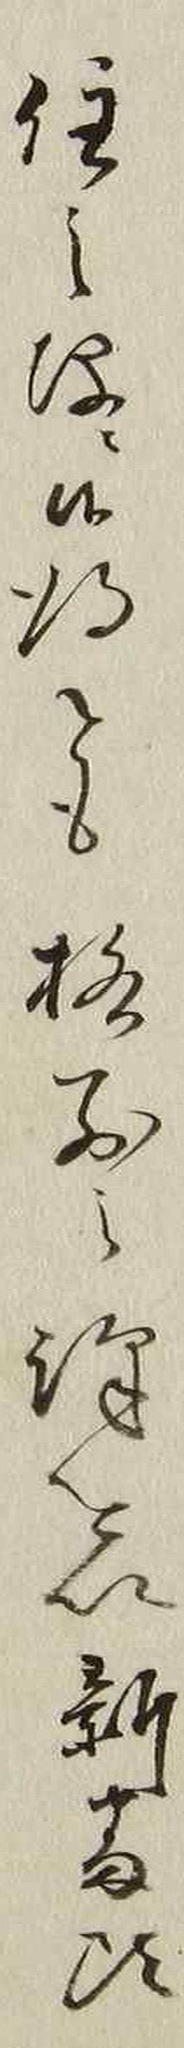住之儀に候得とも格別之譯を以新番頭
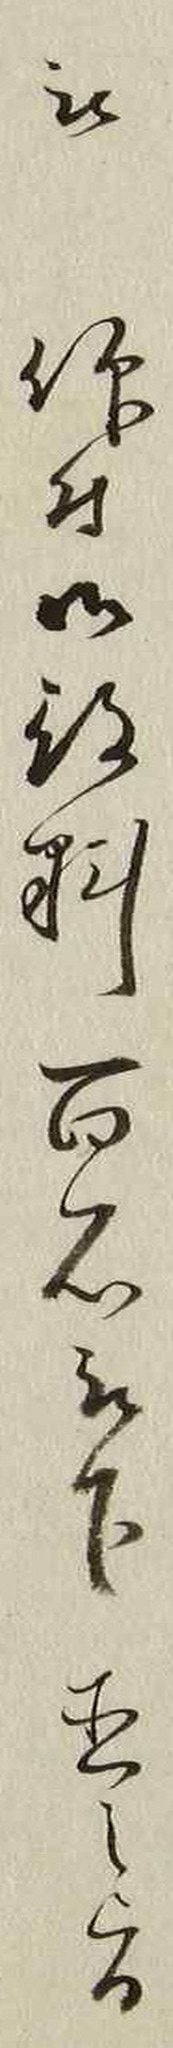被作付御役料百石被下置之旨
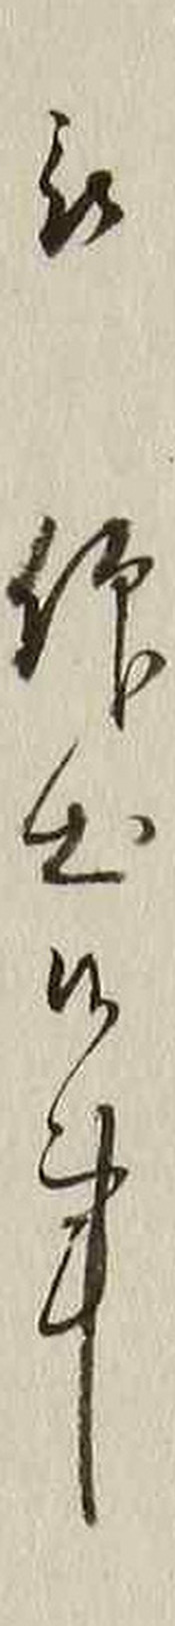被仰出候事
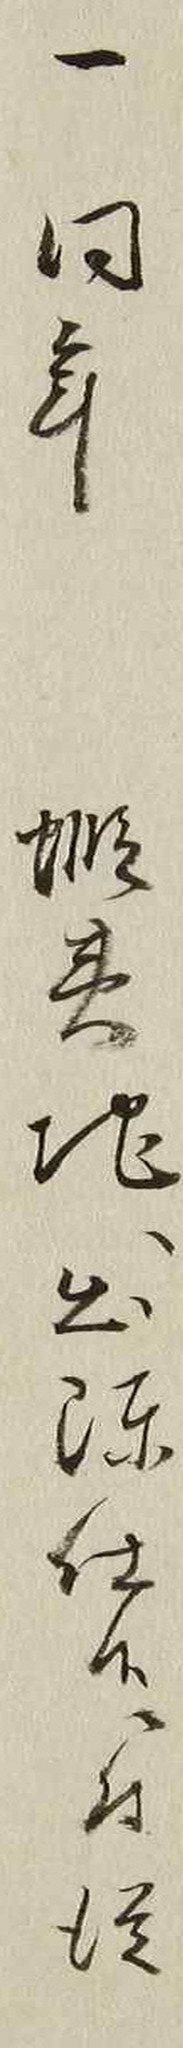一同年蝦夷地へ出陣仕候に付従
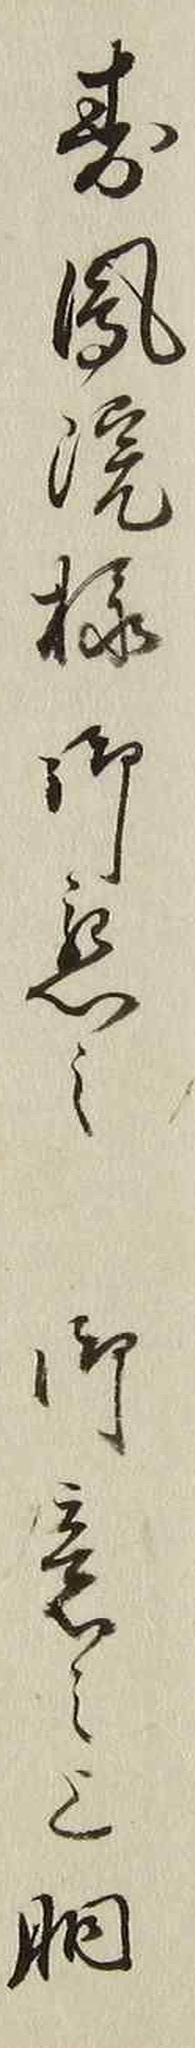寿鳳院様御懇之御意之上胴
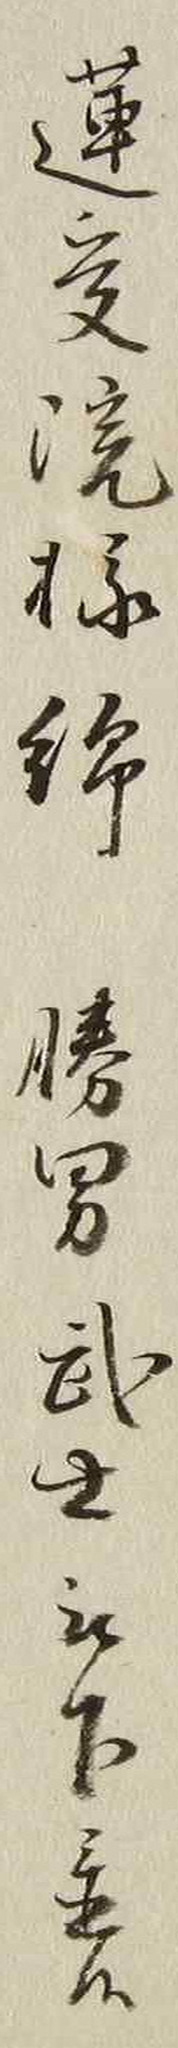蓮受院様綿勝男弐士被下置候
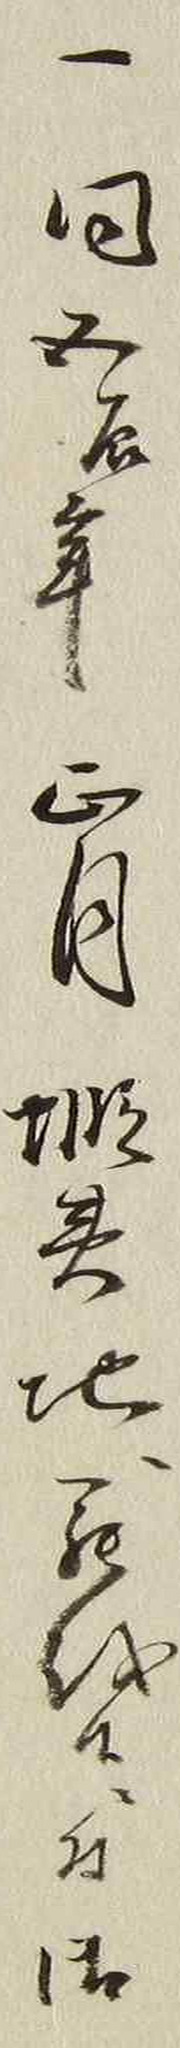一同五辰年正月蝦夷地へ罷越候に付御
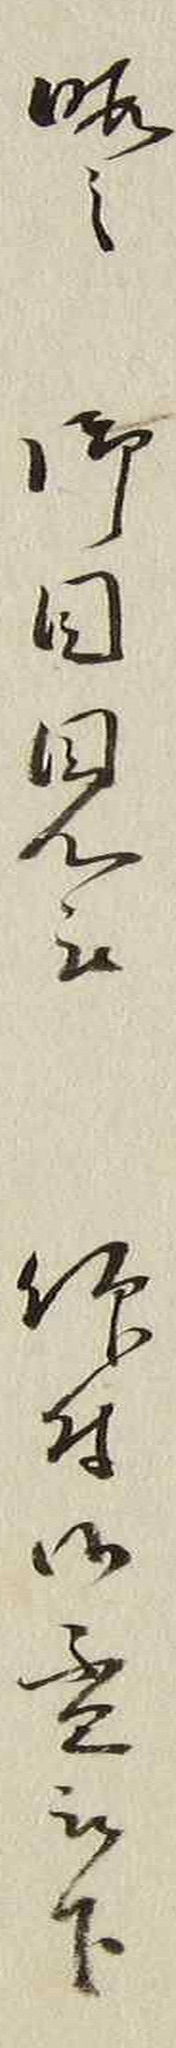暇之御目見被仰付御盃被下
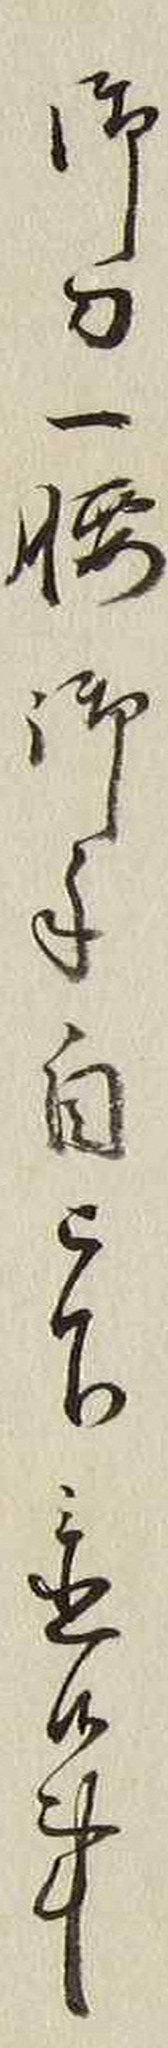御刀一腰御手自被下置候事
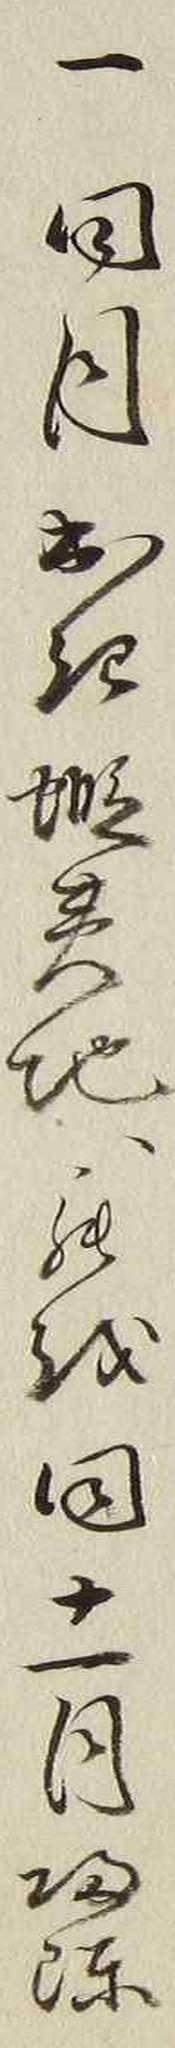一同月出起蝦夷地へ罷越同十一月帰陣
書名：諸士系譜　巻之159　な之部1
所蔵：会津若松市立会津図書館
